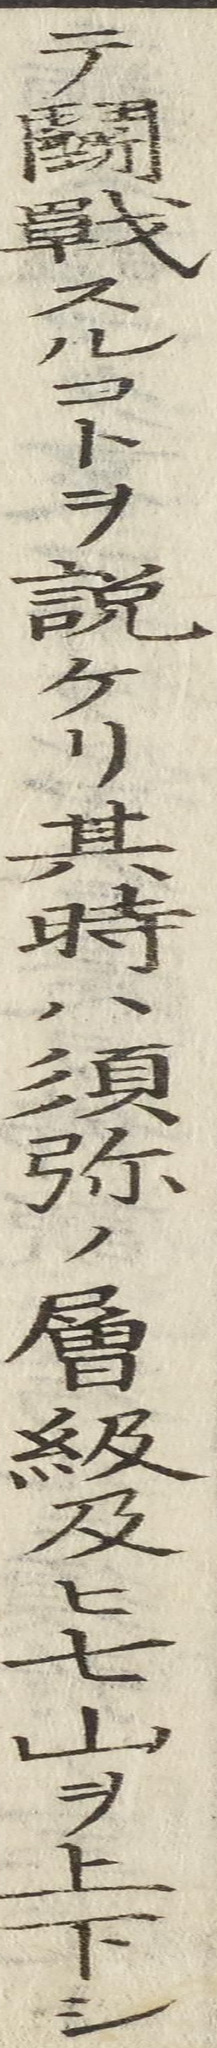テ闘戦スルコトヲ説ケリ其時ハ須弥ノ層級及ヒ七山ヲ上下シ
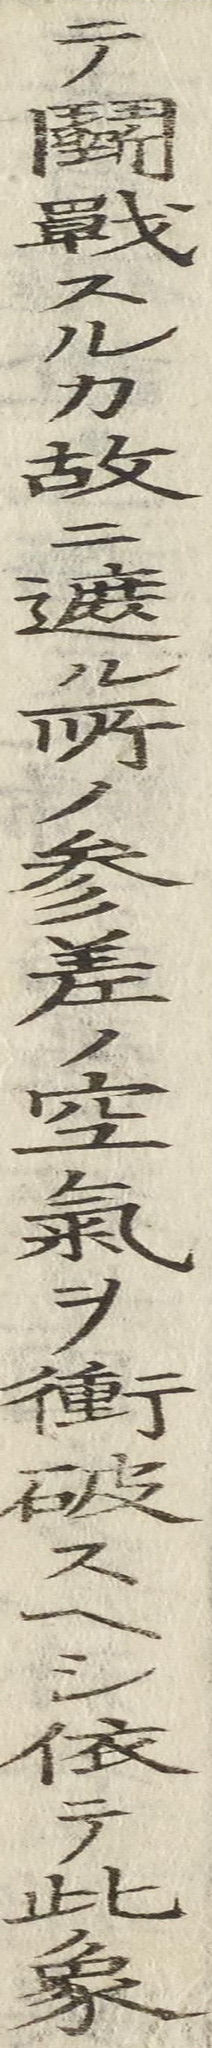テ闘戦スルカ故ニ遮ル所ノ参差ノ空気ヲ衝破スヘシ依テ此象
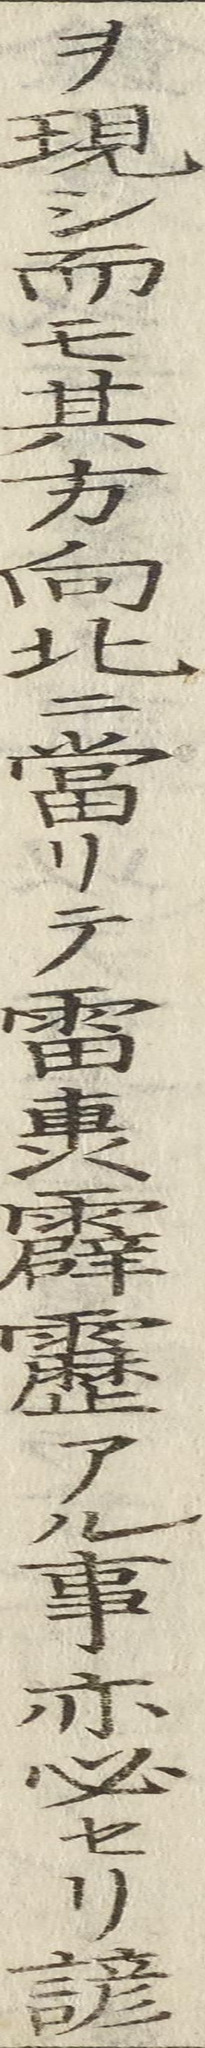ヲ現シ而モ其方向北ニ当リテ雷轟霹靂アル事亦必セリ諺
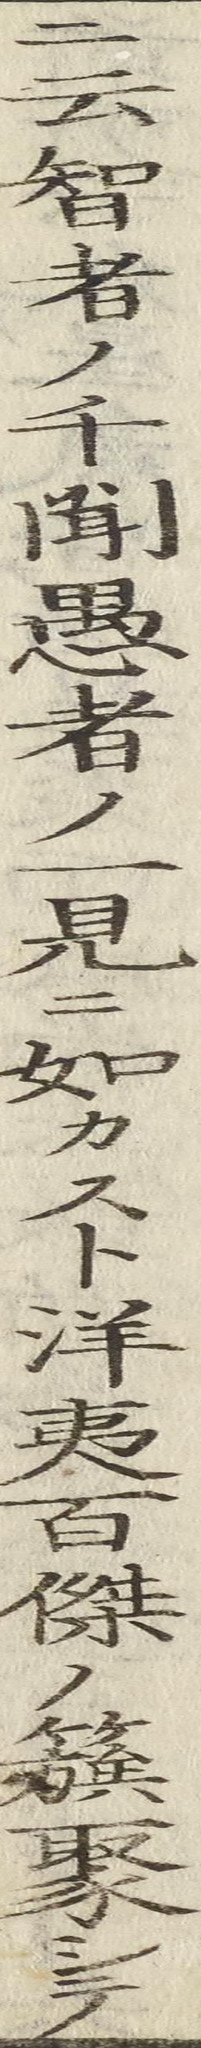ニ云智者ノ千聞愚者ノ一見ニ如カスト洋夷百傑ノ籏聚シテ
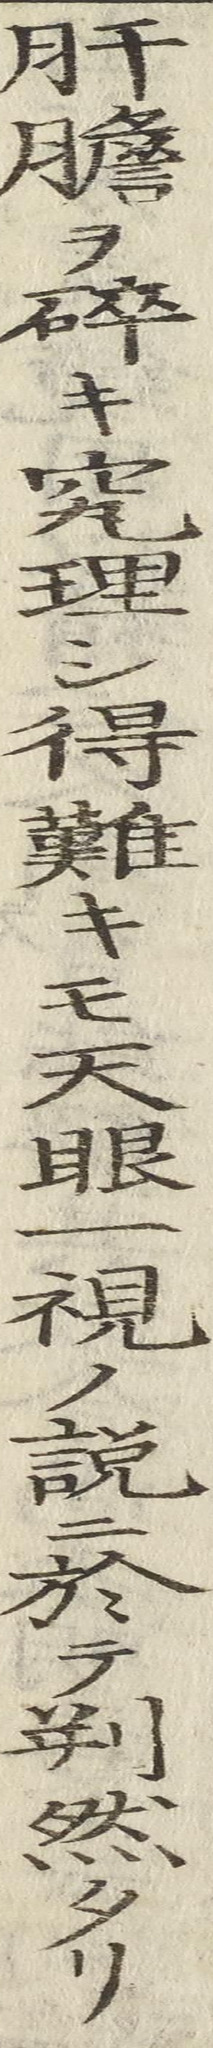肝膽ヲ砕キ究理シ得難キモ天眼一視ノ説ニ於テ判然タリ
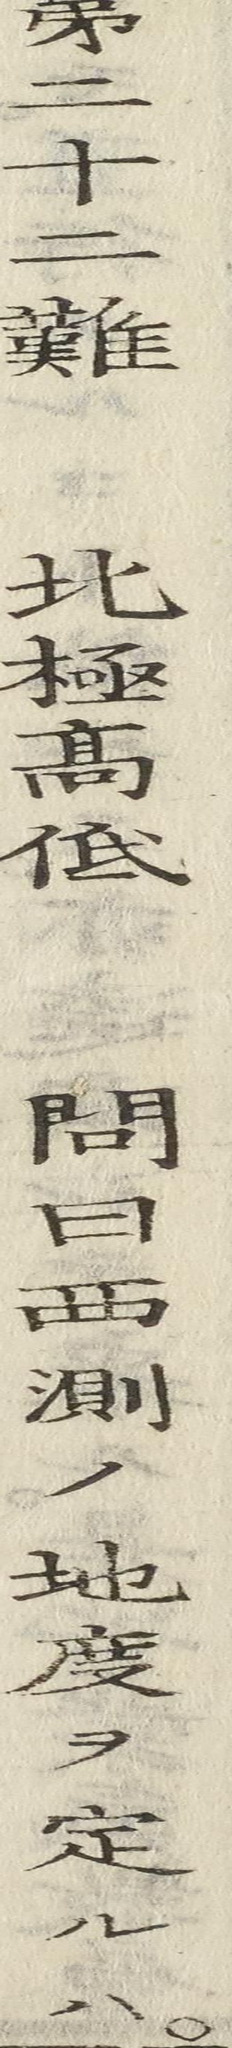第二十二難北極南低問曰西測ノ地度ヲ定ルハ。
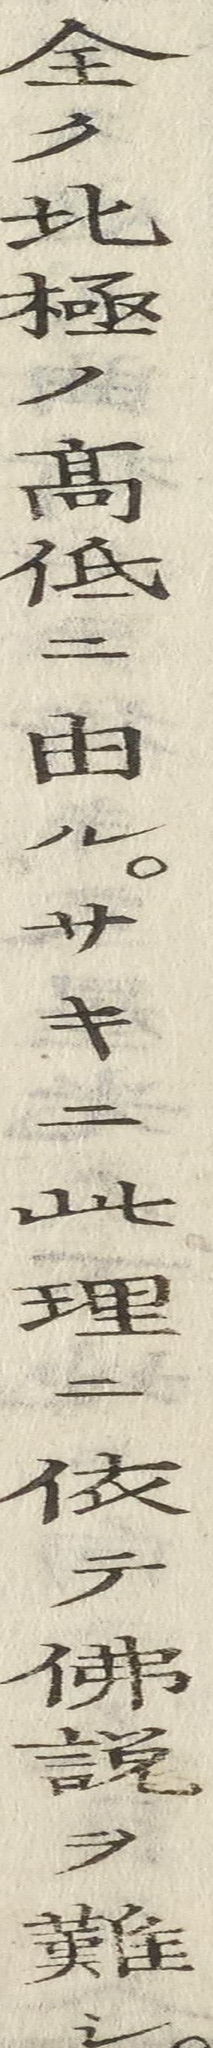全ク北極ノ高低ニ由ル。サキニ此理ニ依テ仏説ヲ難シ。
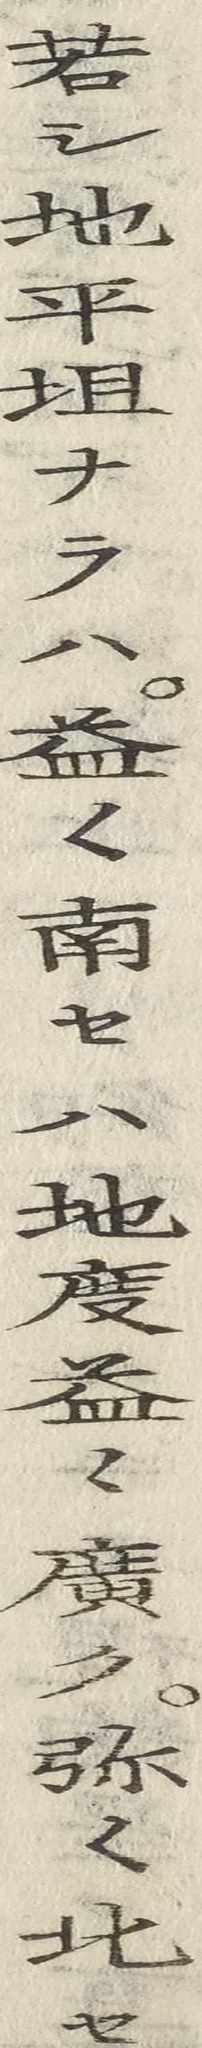若シ地平坦ナラハ。益〱南セハ地度益〱広ク。弥〱北セ
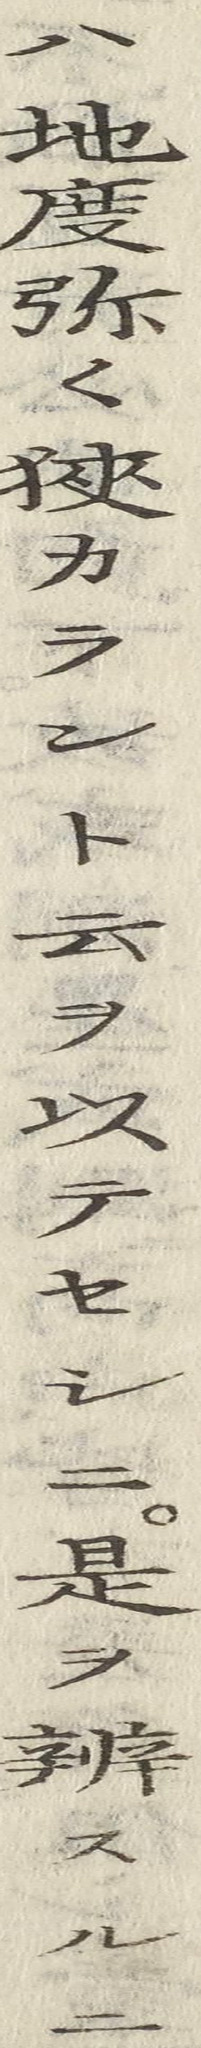ハ地度弥〱狭カラント云ヲ以テセシニ。是ヲ弁スルニ
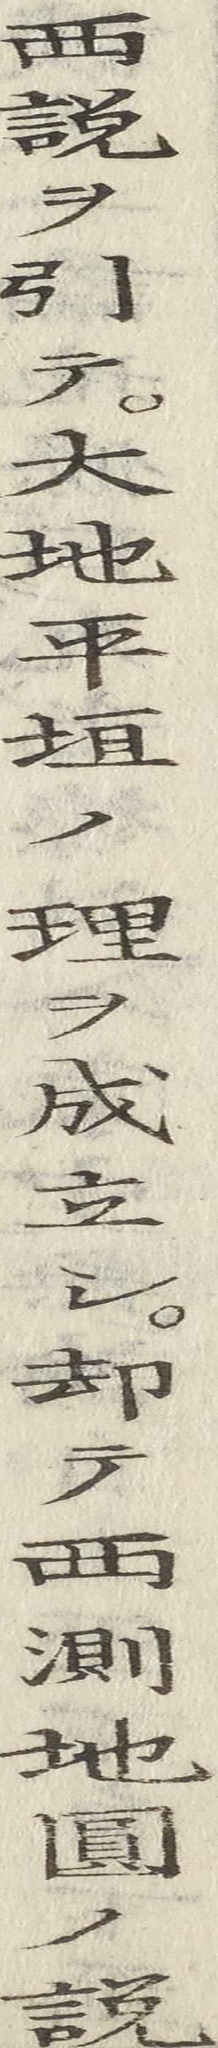西説ヲ引テ。大地平坦ノ理ヲ成立シ。却テ西測地円ノ説
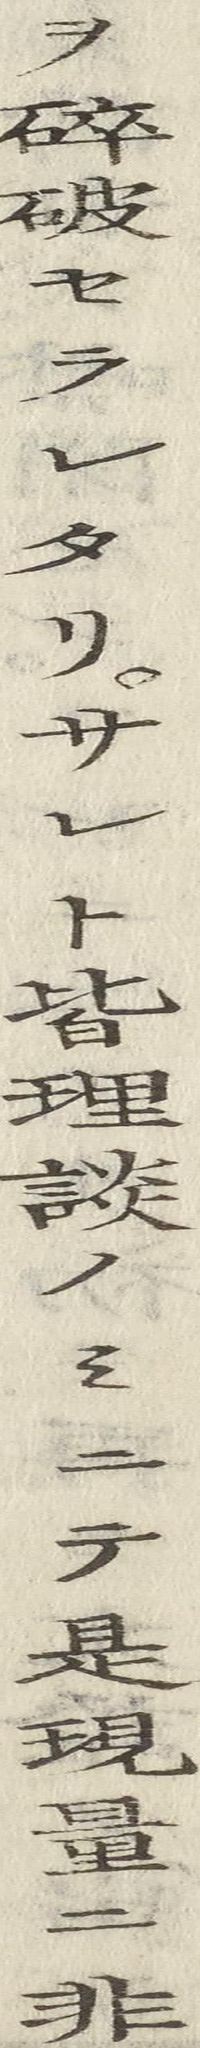ヲ碎破セラレタリ。サレト皆理談ノミニテ是現量ニ非
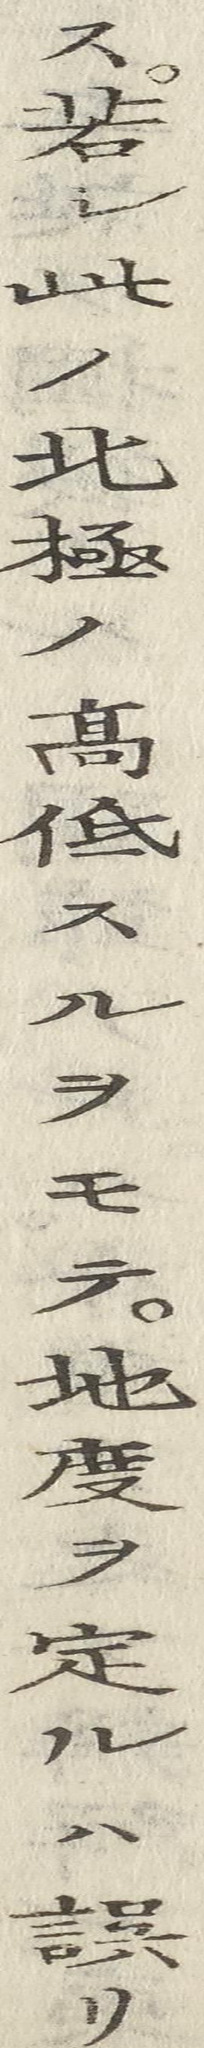ス。若シ此ノ北極ノ高低スルヲモテ。地度ヲ定ルハ誤リ
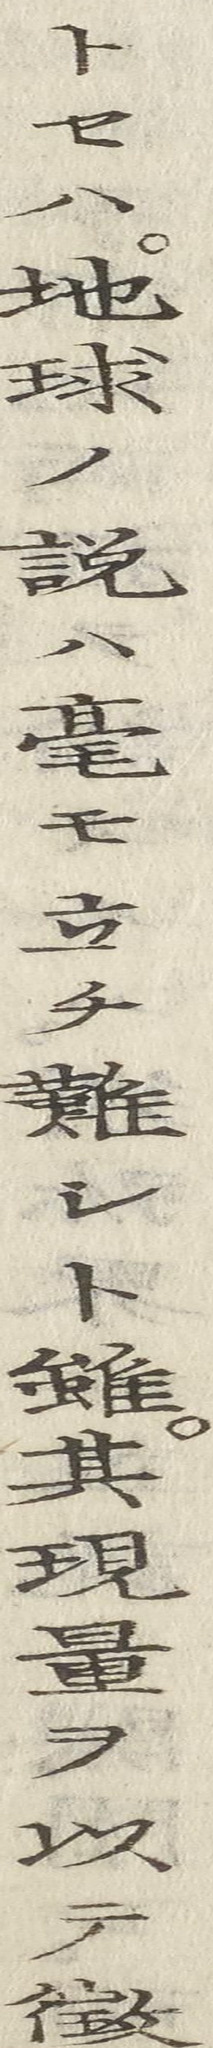トセハ。地球ノ説ハ毫モ立チ難シト雖。其現量ヲ以テ徴
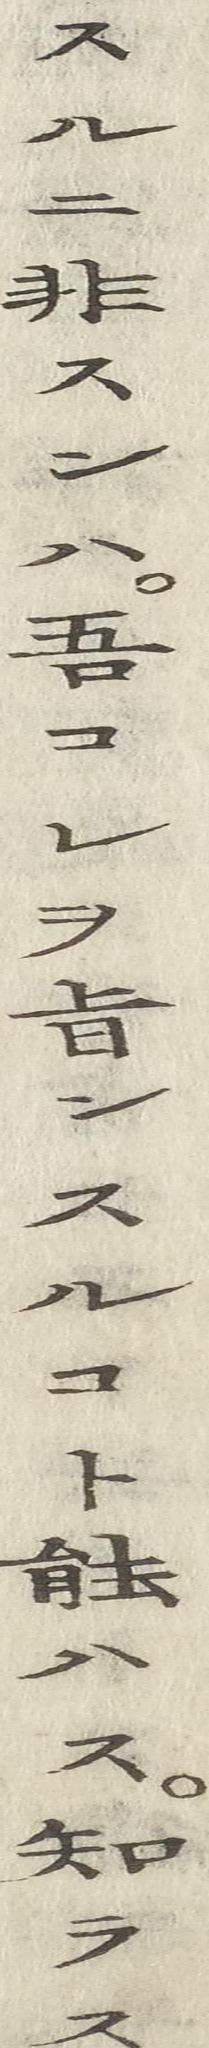スルニ非スレハ。吾コレヲ旨ンスルコト能ハス。知ラス
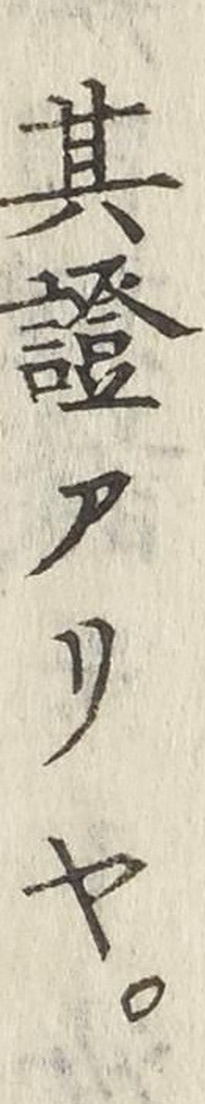其証アリヤ。

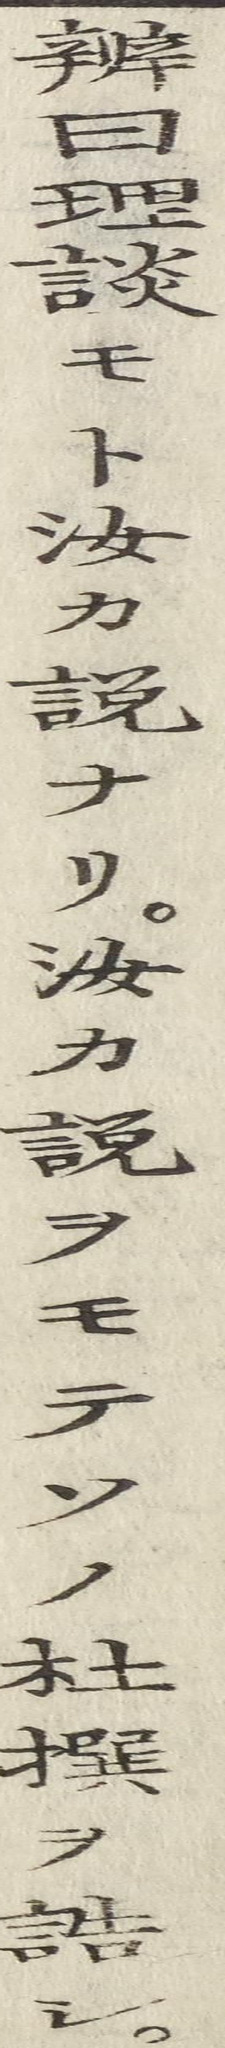弁曰理談モト汝カ説ナリ。汝カ説ヲモテソノ杜撰ヲ誥シ。
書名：護法新論　二編　中
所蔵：東京大学地震研究所図書室 Earthquake Research Institute Library, The University of Tokyo, JAPAN
